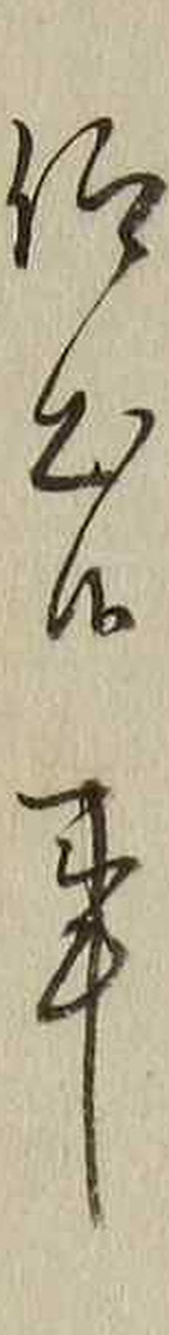仰出候事
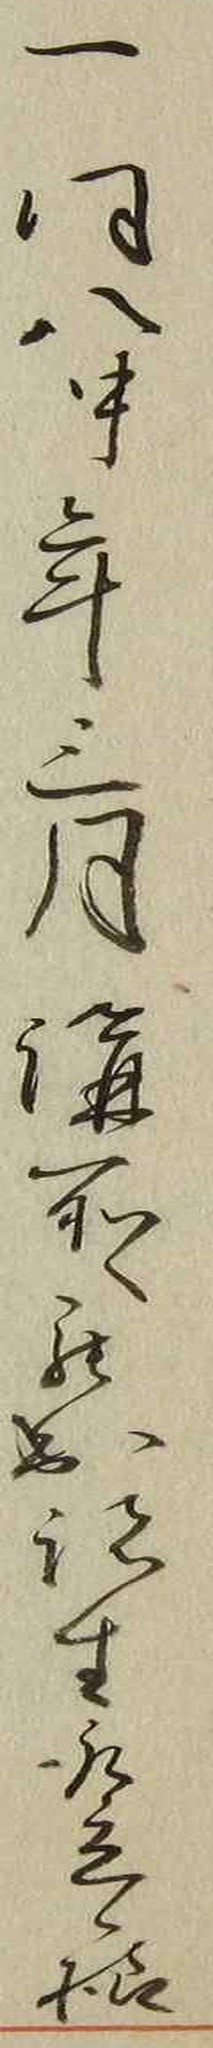一同八申年三月講所へ罷出諸生取立候様
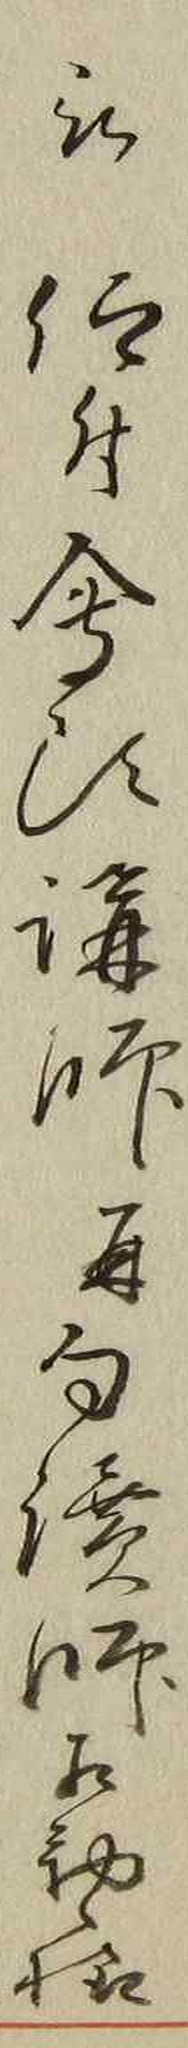被仰付会頭講師再句読師相勤候様
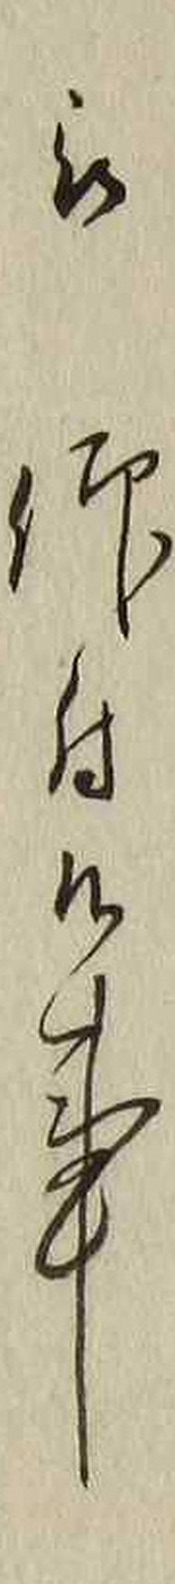被仰付候事
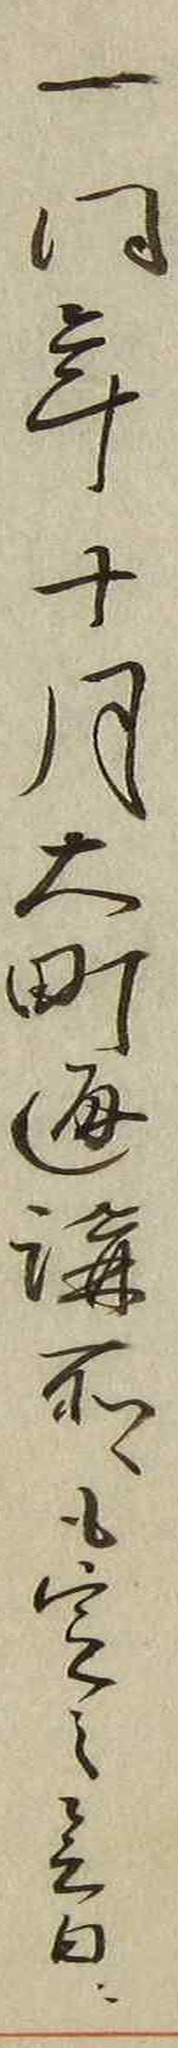一同年十月大町通講所へも定之会日ニ
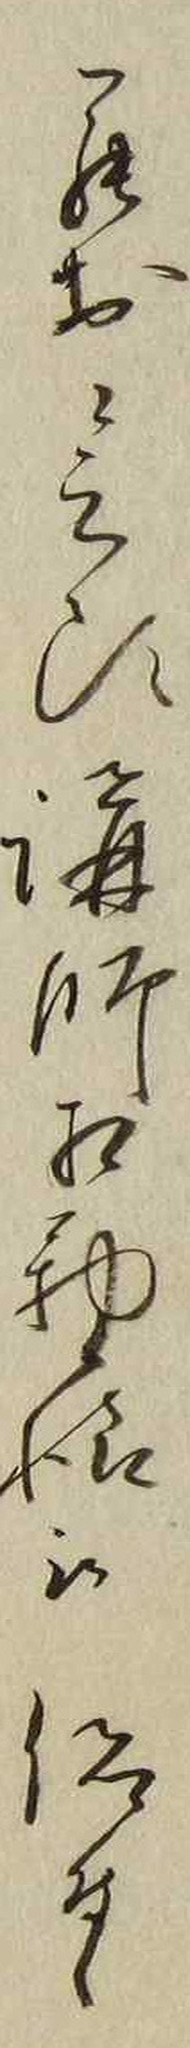罷出会頭講所相勤候様被仰付候
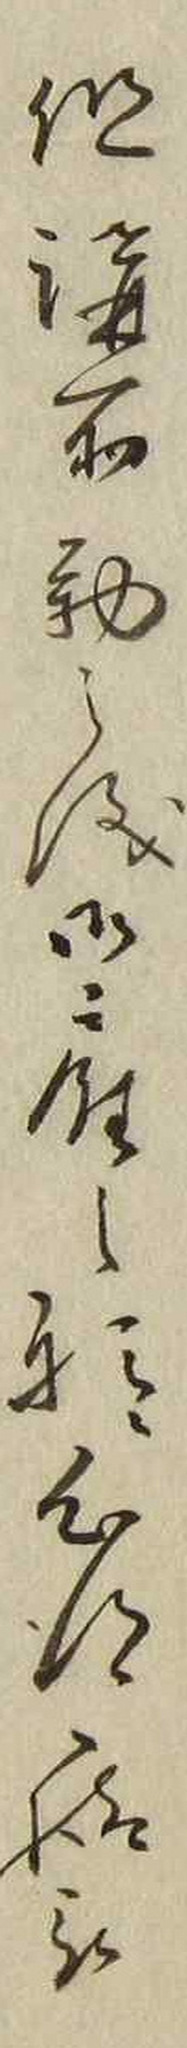但講所勤之儀御雇之願心得候様被

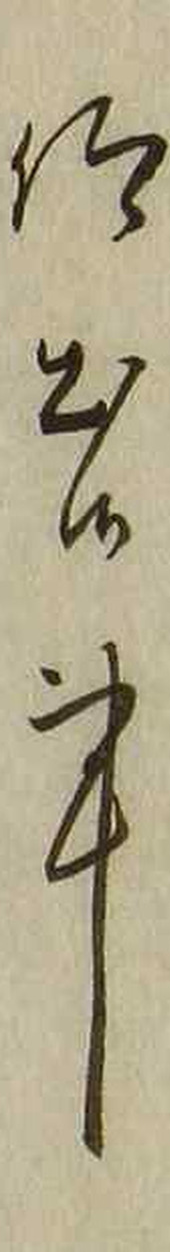仰出候事
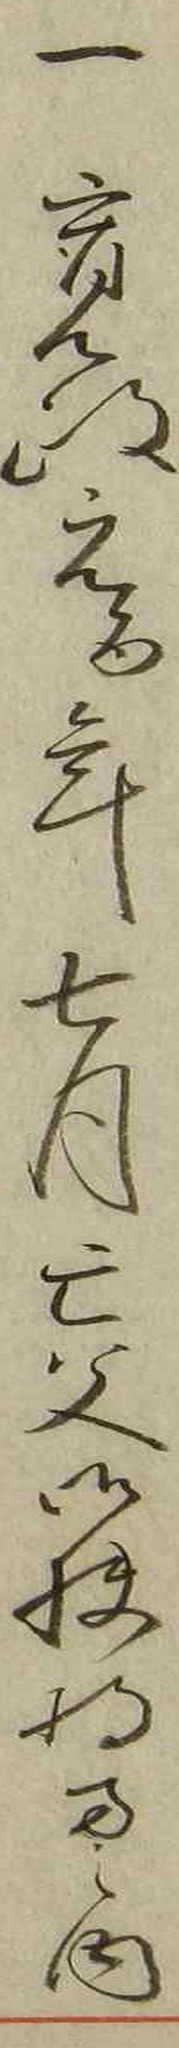一寛政元酉年七月亡父御扶持方之内
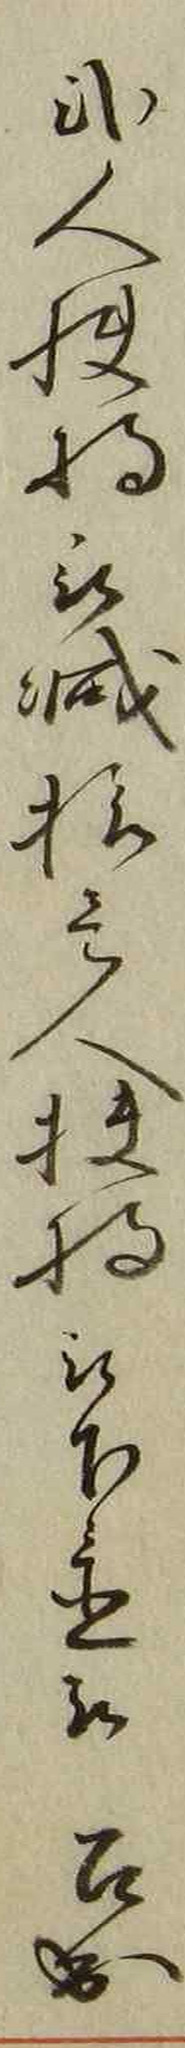弐人扶持被減拾壱人扶持被下置被召出
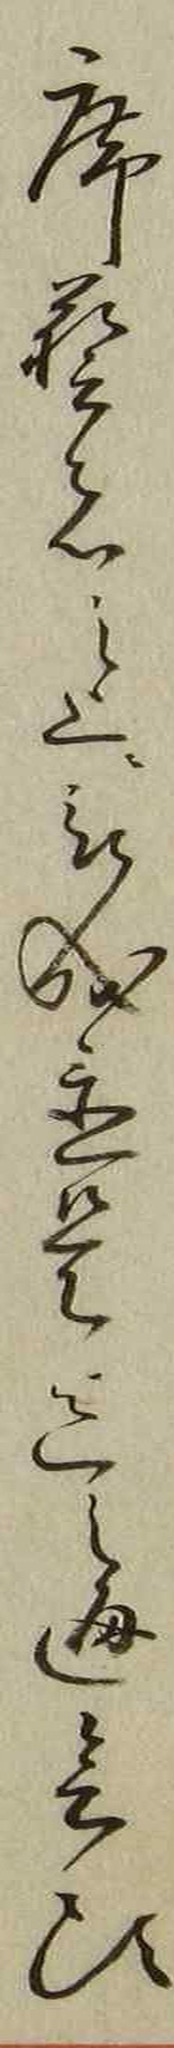席芸者之上に被成置是迄之通会頭
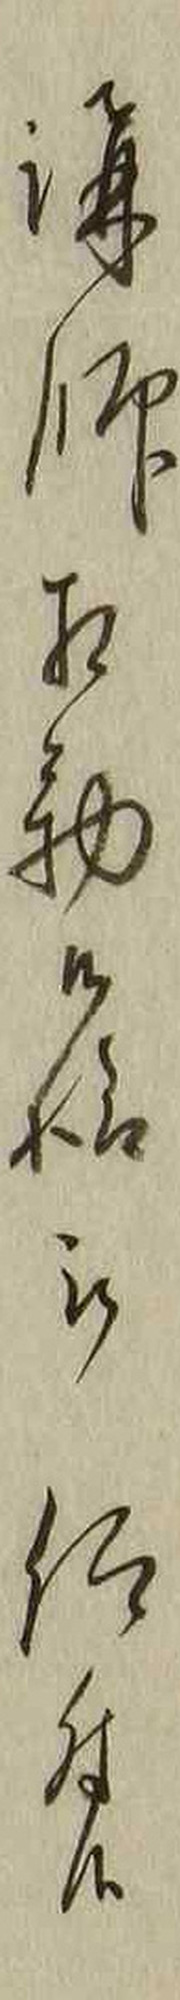講師相勤候様被仰付候
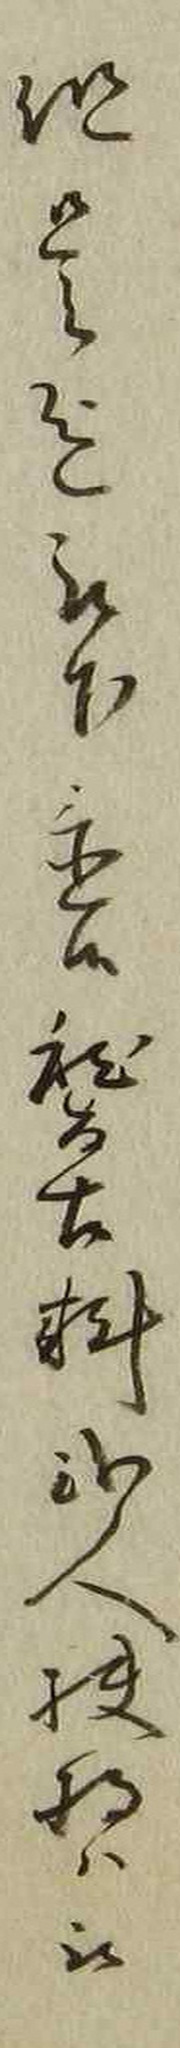但是迄被下置候稽古料弐人扶持は被
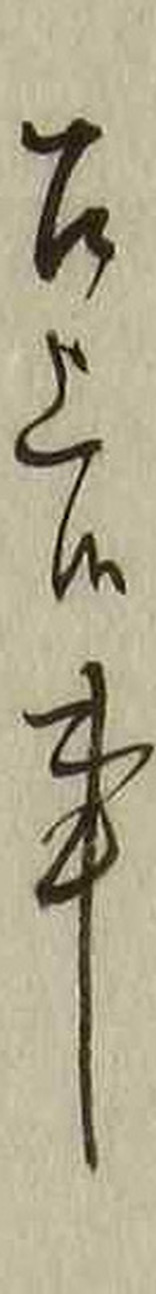召上候事
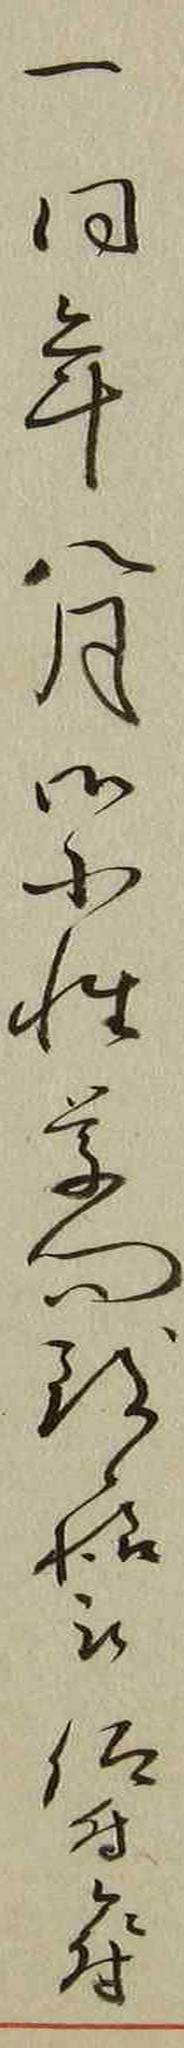一同年八月御小性学問致候様被仰付候に付
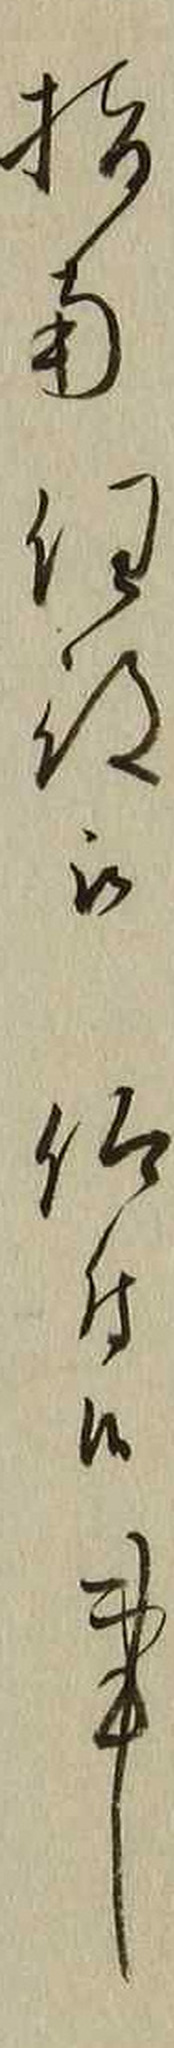指南任役被仰付候事
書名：諸士系譜　巻之3　い之部3
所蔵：会津若松市立会津図書館
